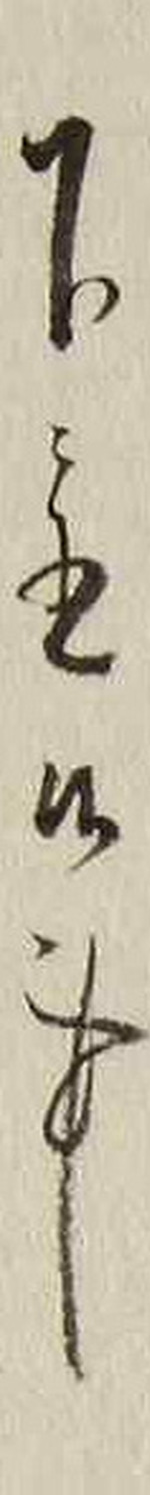下置候事
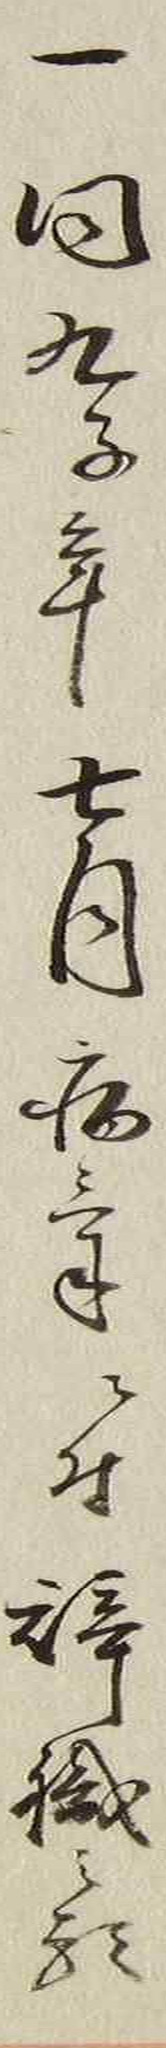一同九子年七月病気に付辞職之願
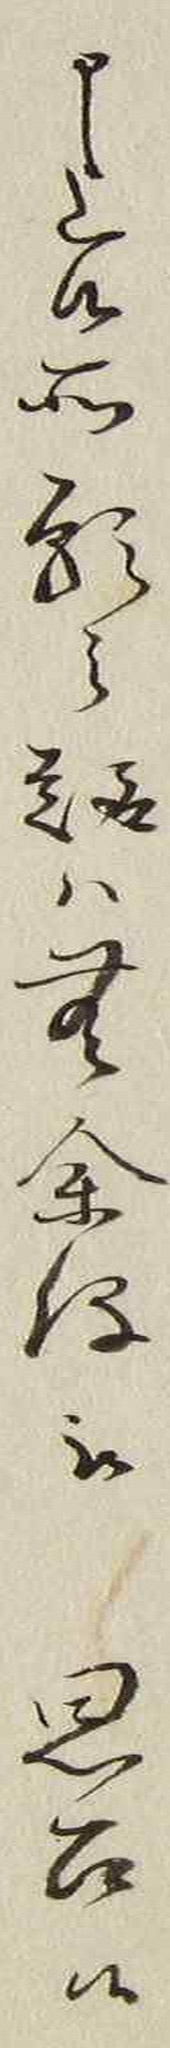申上候所願之趣は無余儀被思召候
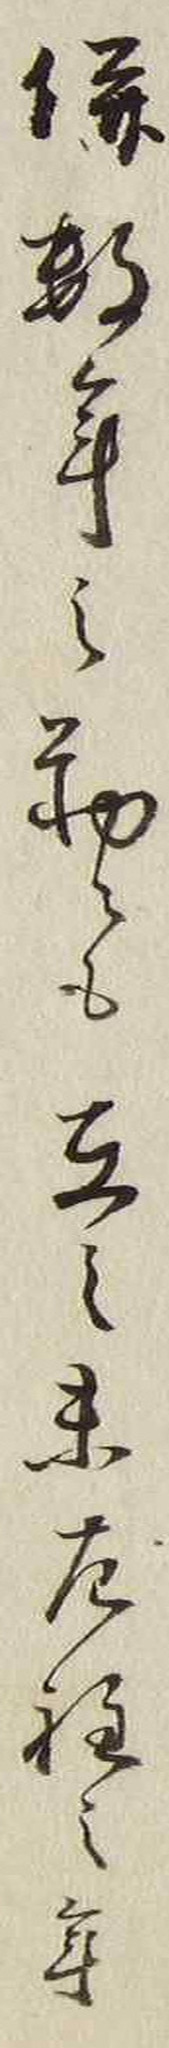併数年之勤にも在之未左程程之年
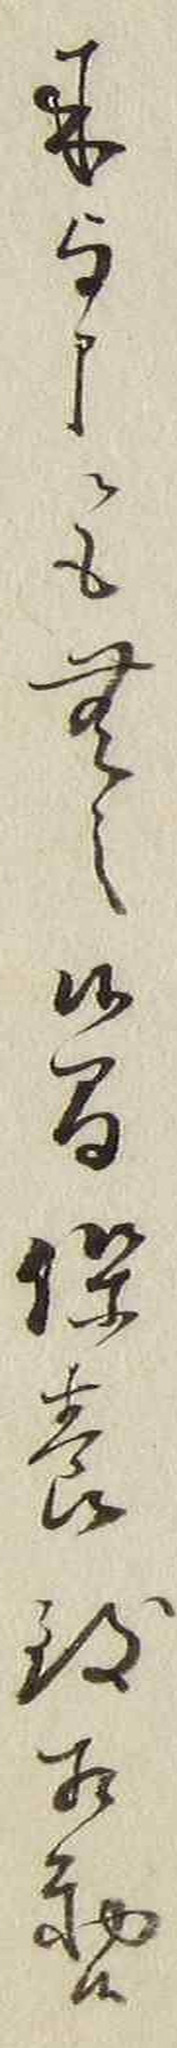来と申にも無之候間保養致相勤候

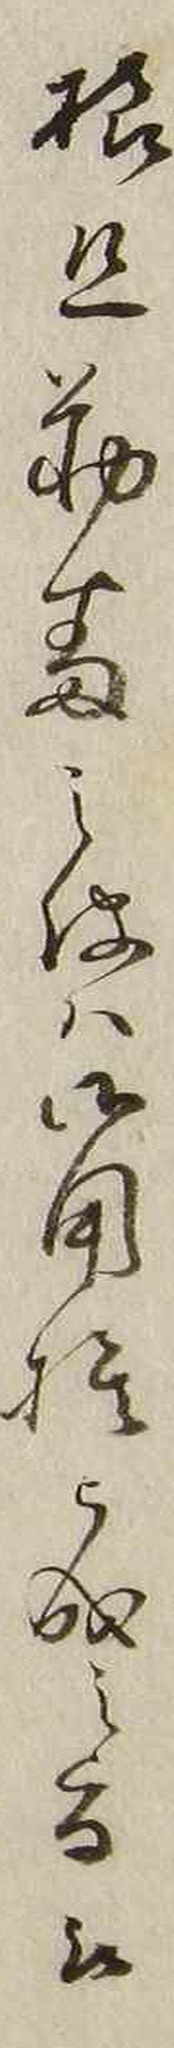様旦勤番之儀は御用捨被成之旨被
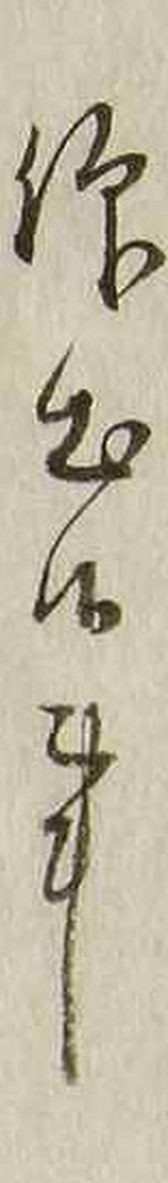仰出候事
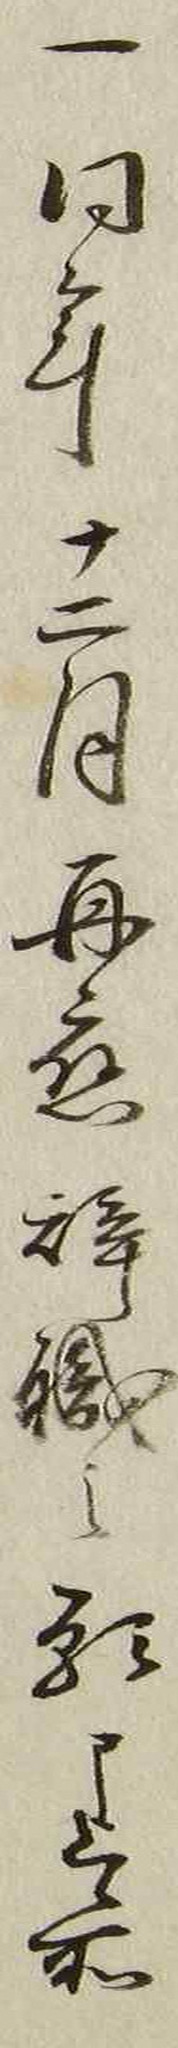一同年十二月再応辞職之願申上候所
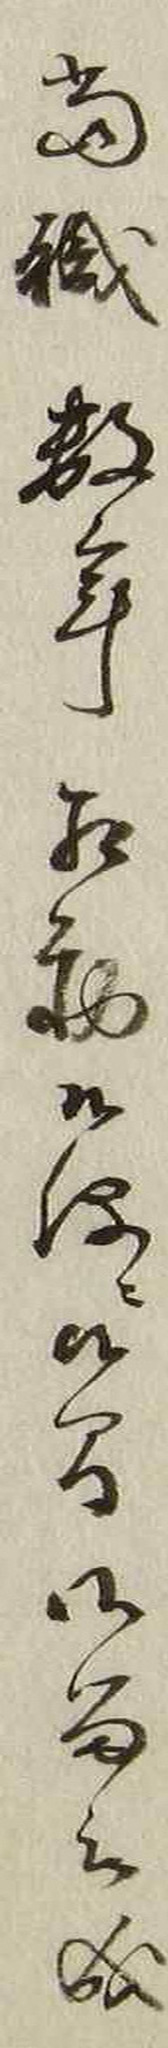当職数年相勤候儀に候間御留被成
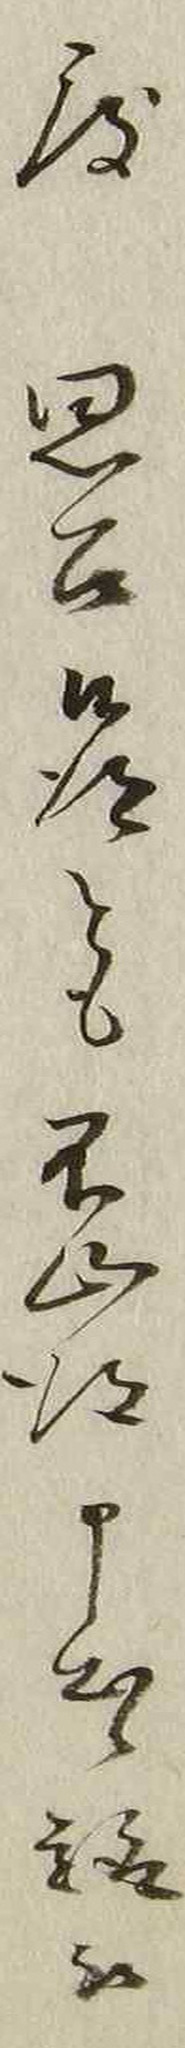度思召候得とも不止得申出候趣被
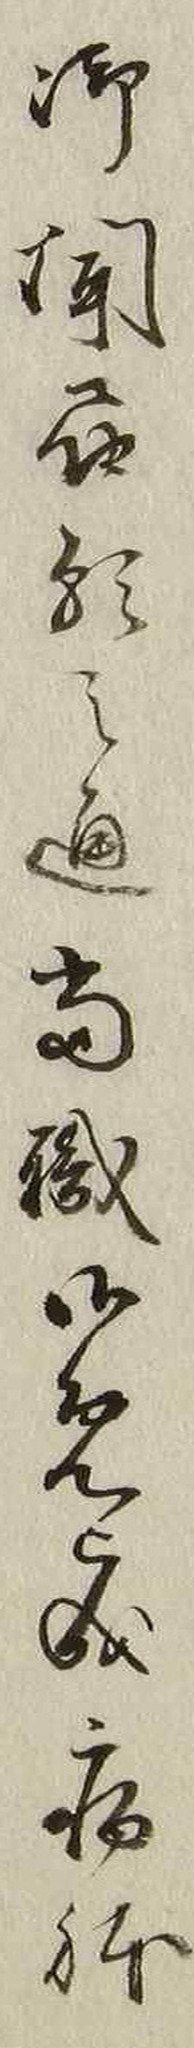御聞届願之通当職御免被成病体
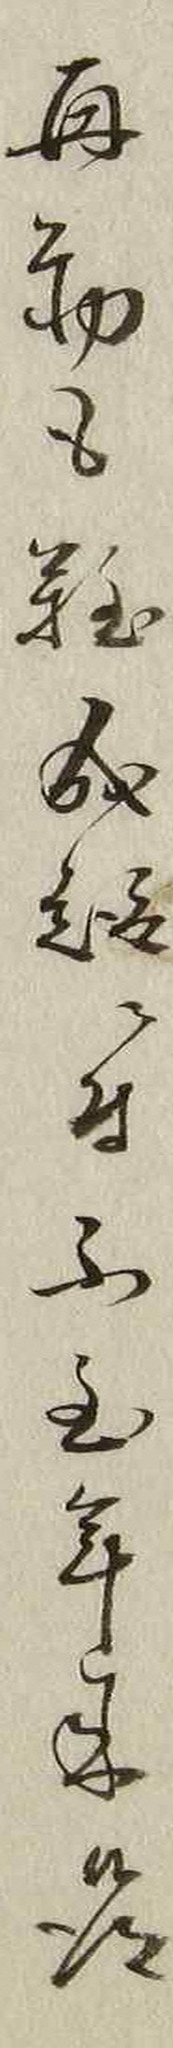再勤も難成趣に付不至年來候得
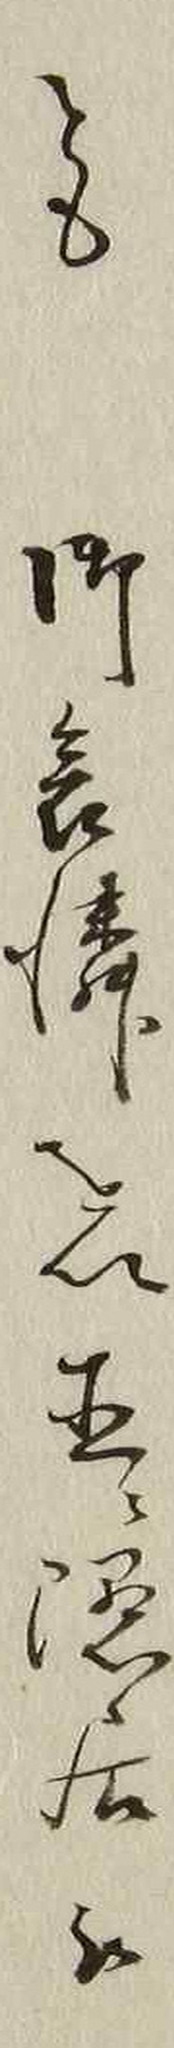とも御哀憐を以直々隠居被
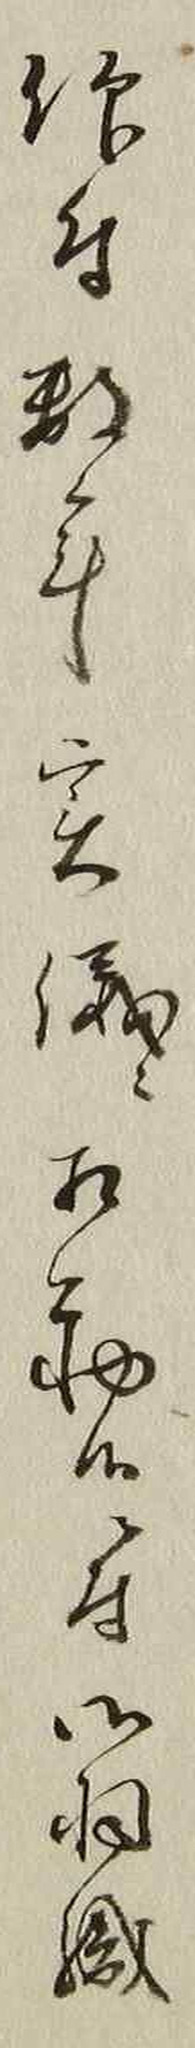仰付数年実儀に相勤候に付御羽織
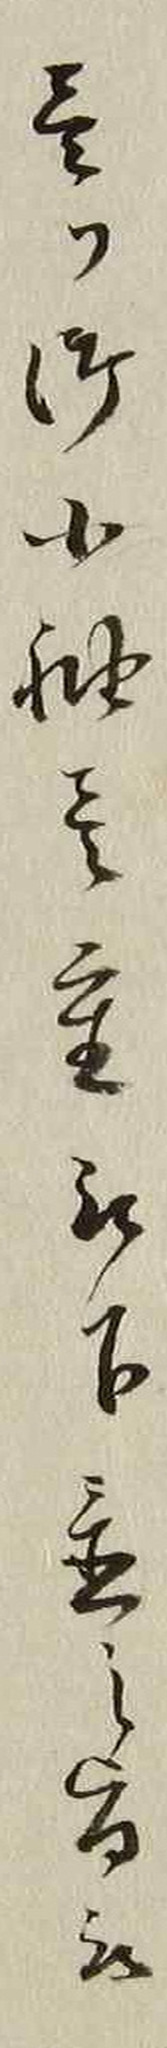壱つ御小袖壱重被下置之旨被
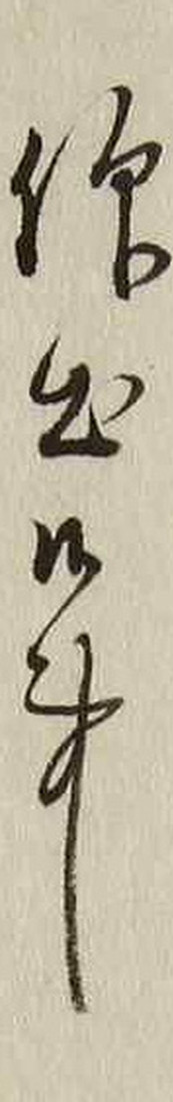仰出候事
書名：諸士系譜　巻之159　な之部1
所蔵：会津若松市立会津図書館
